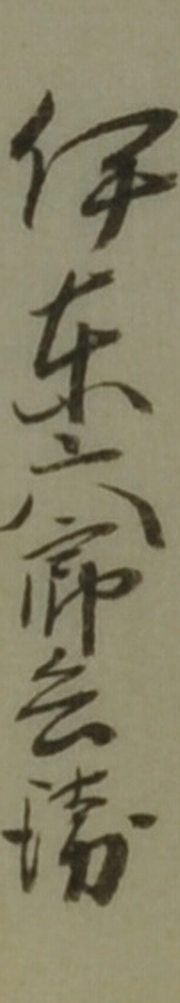伊東六郎兵衛
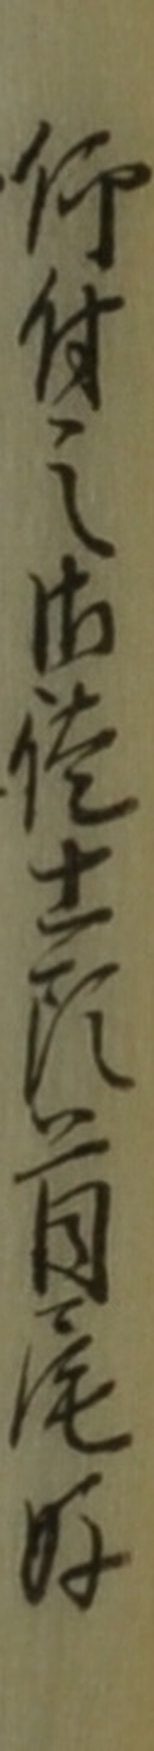仰付之御徒士頭首尾好
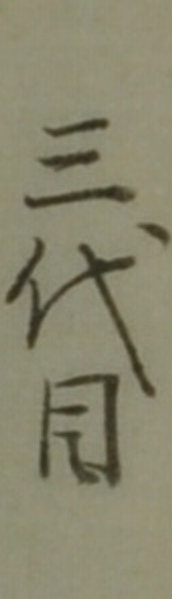三代目
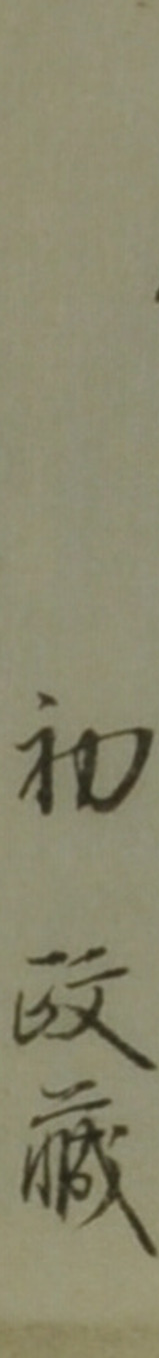初政蔵
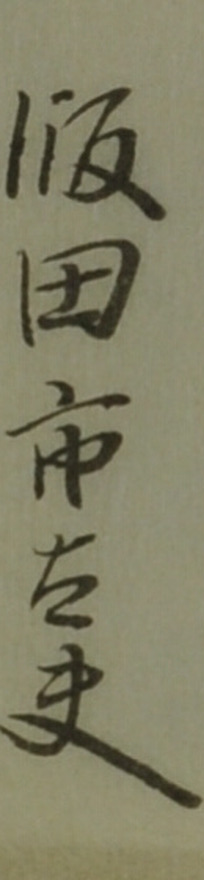飯田市太夫
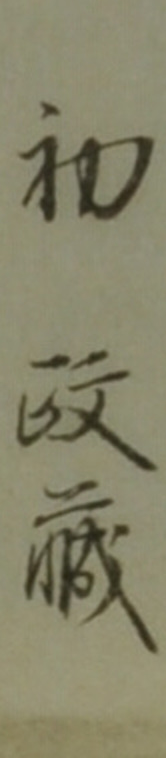初政蔵
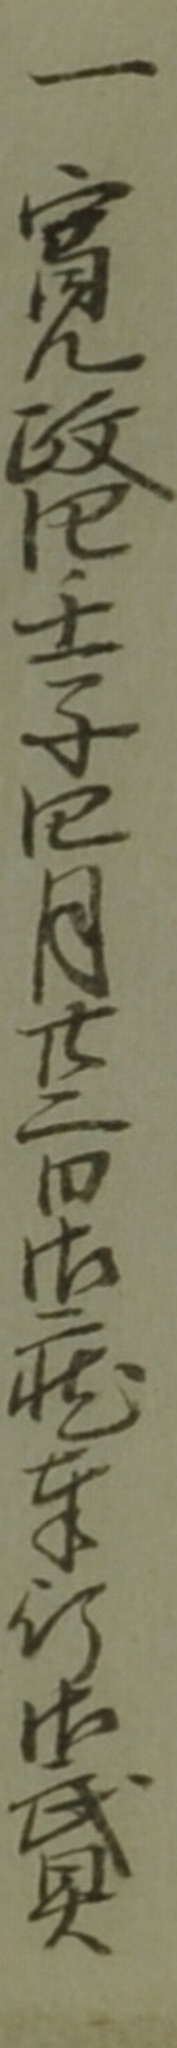一寛政四壬子四月廿二日御蔵奉行御武具
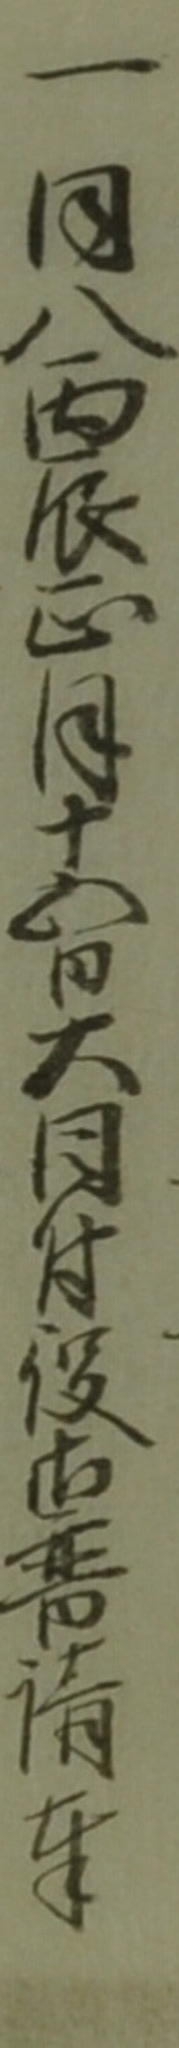一同八丙辰正月十五日大目付役御普請奉
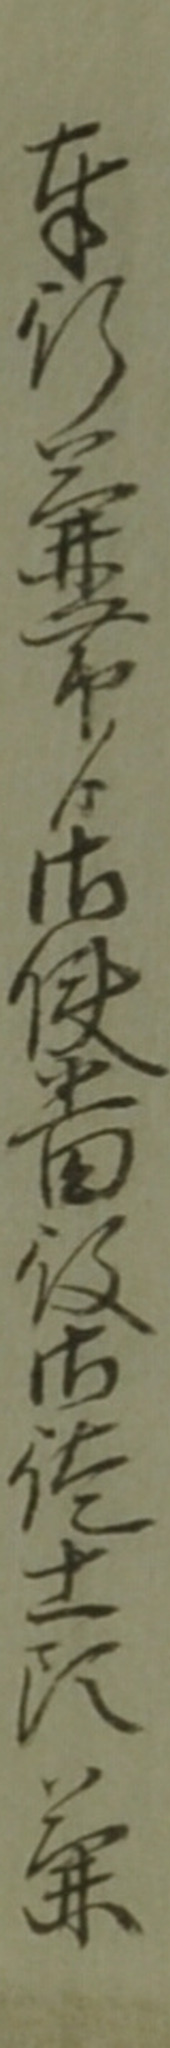奉行兼帯ゟ御使番役御徒士頭兼
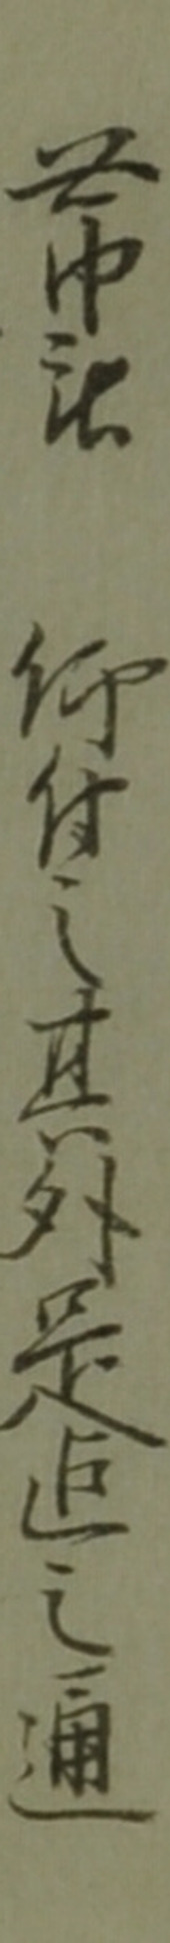帯被仰付之其外是迄之通
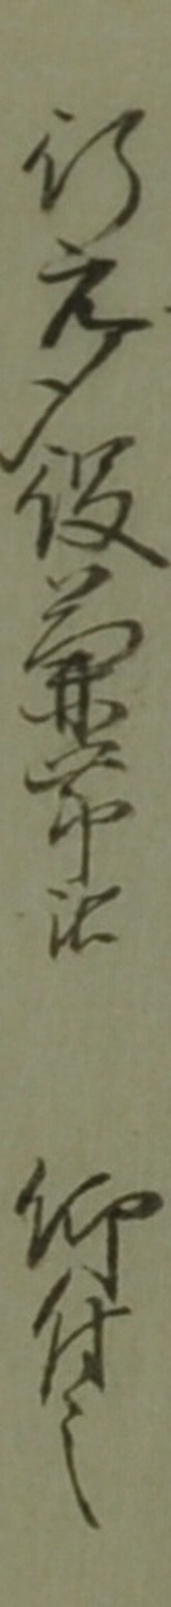行元〆役兼帯被仰付之
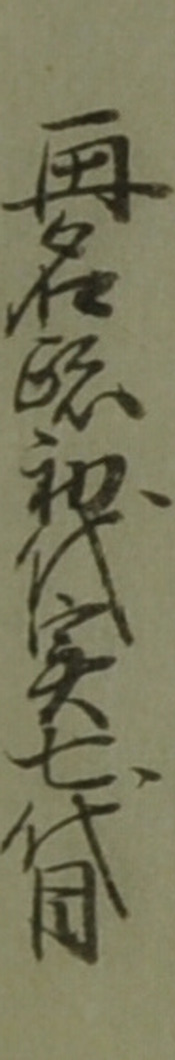再名跡初代実七代目
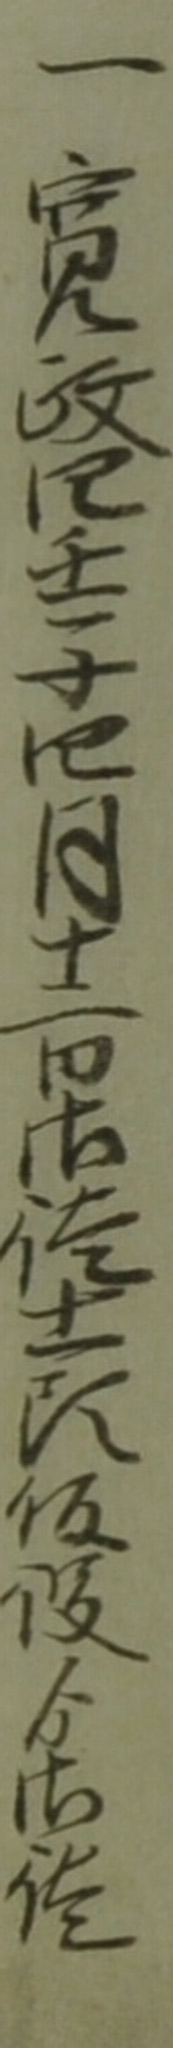一寛政四壬子四月十二日御徒士頭仮役ゟ御徒
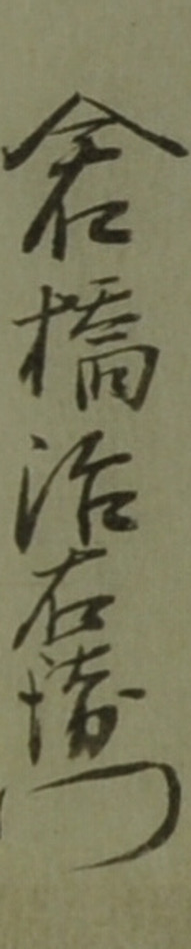倉橋治右衛門
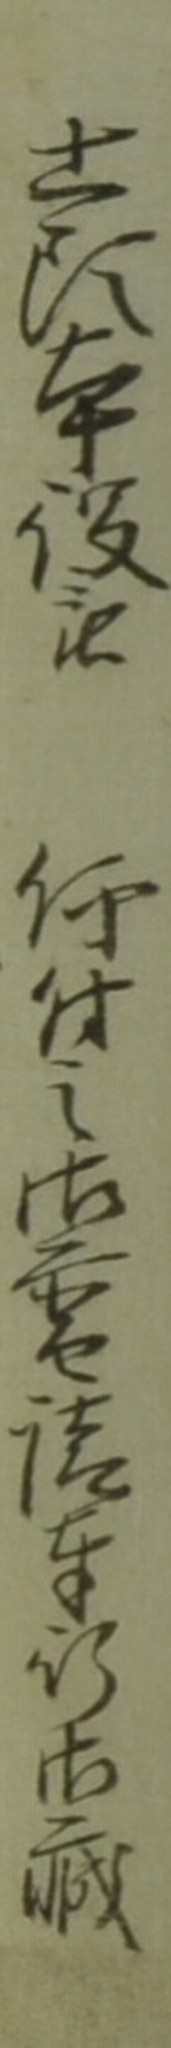士頭本役被仰付之御普請奉行御蔵

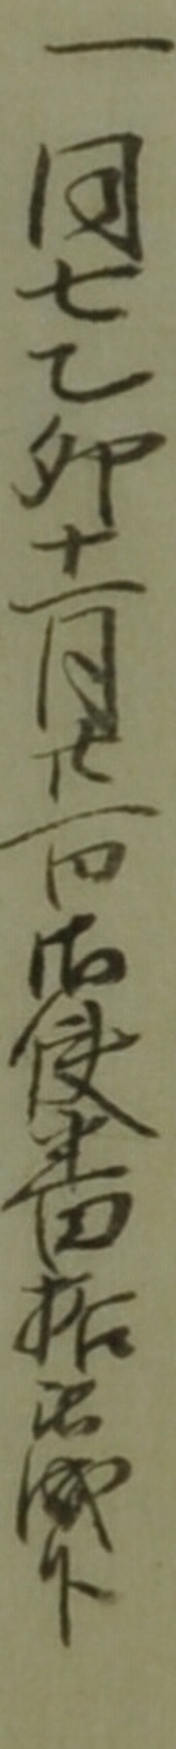一同七乙卯十一月廿一日御使番格被成下
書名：諸御役代々録（六）
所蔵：伊那市立高遠町図書館・合同会社AMANE
